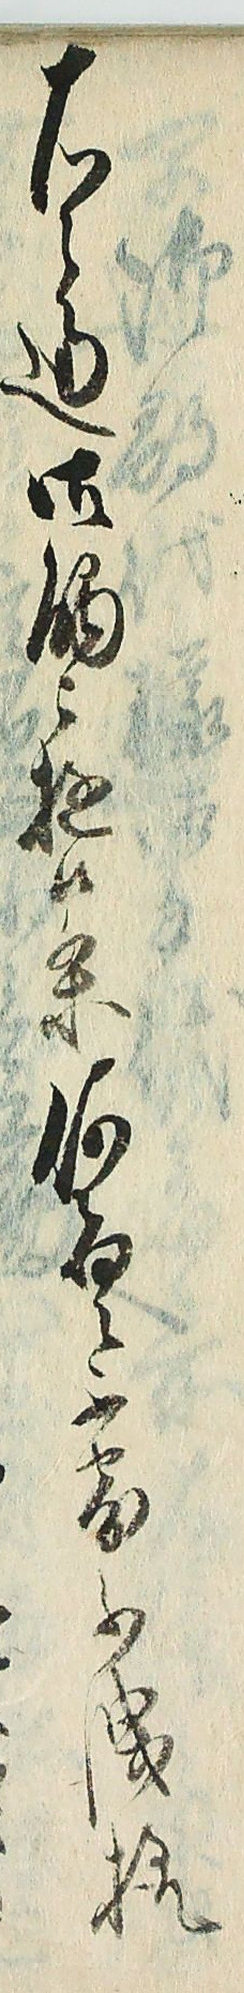右之通御触被遊候条何者不寄不洩様
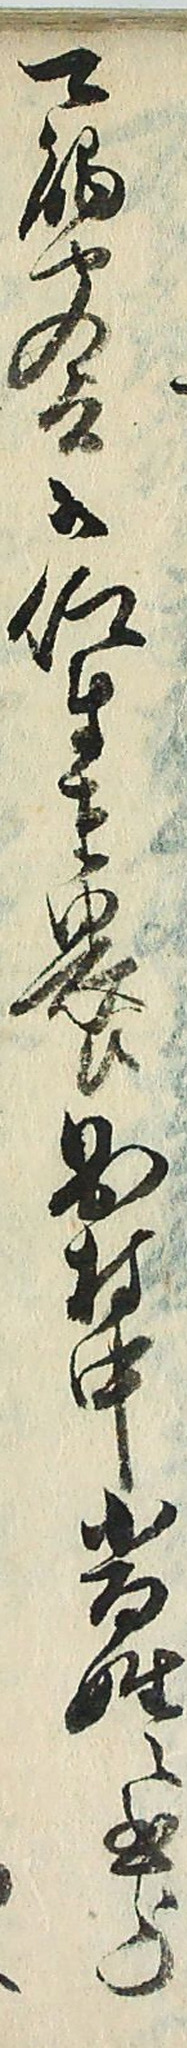可触聞旨被仰付奉畏候則村中小百姓に至迄
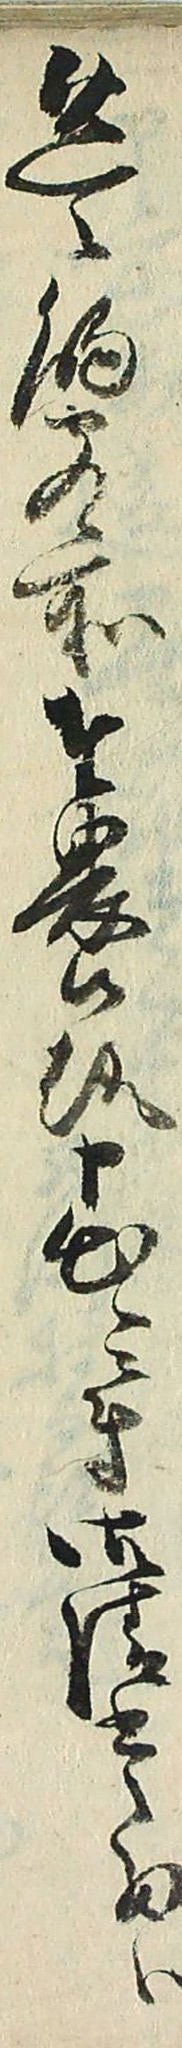逸々触聞候所奉畏候趣申出候に付御請書之義は
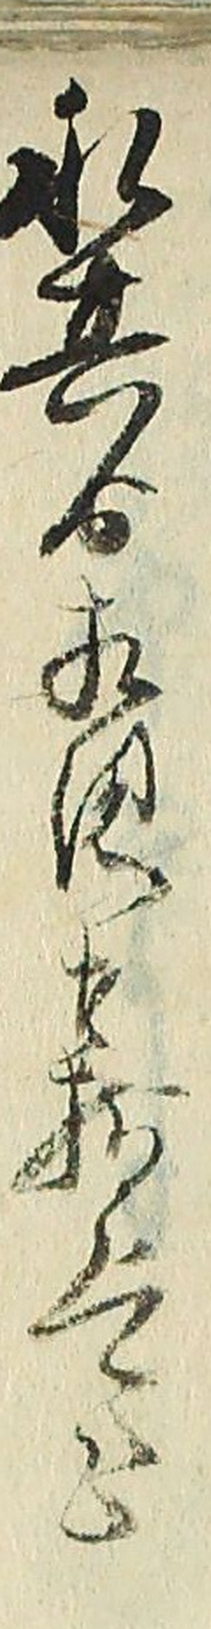私共ゟ相認奉指上候以上
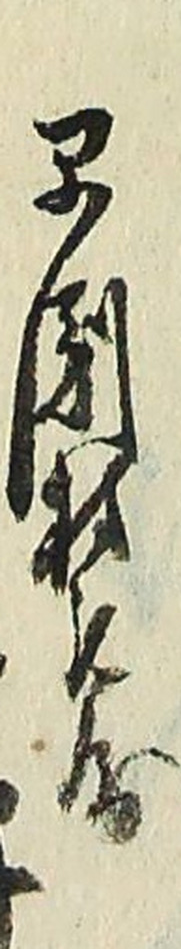池尻村庄屋
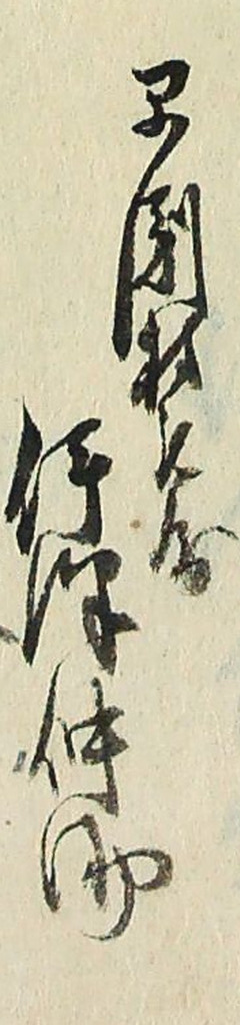井沢仲助
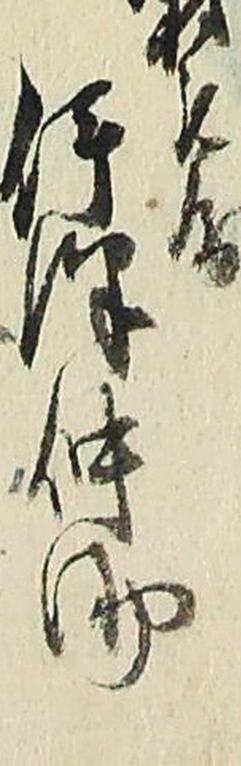井沢仲助
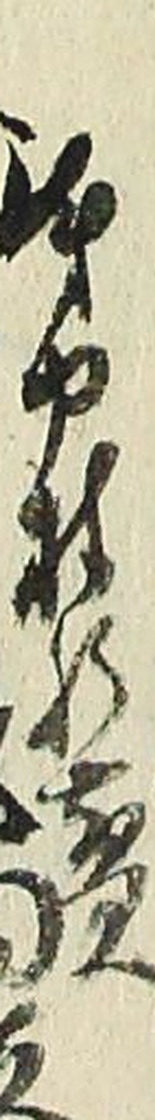府中村肝煎
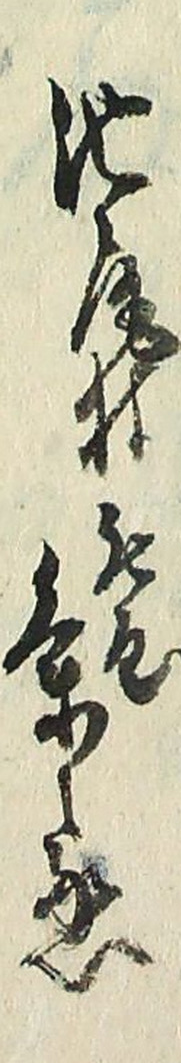池尻村庄屋
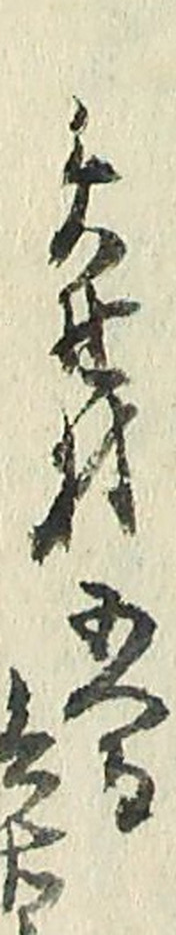矢野村五人与
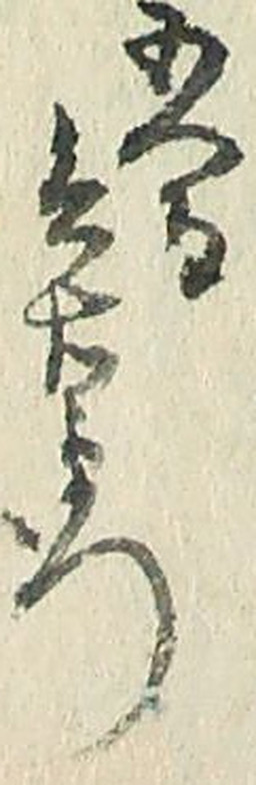壱右衛門
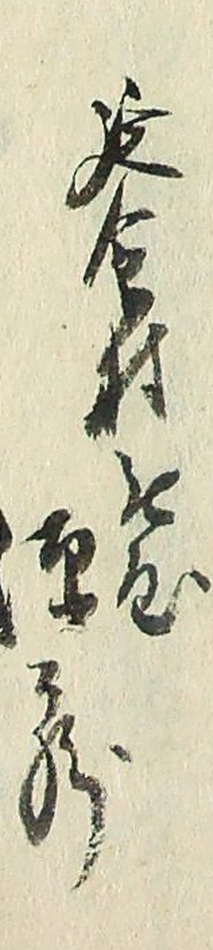延命村庄屋
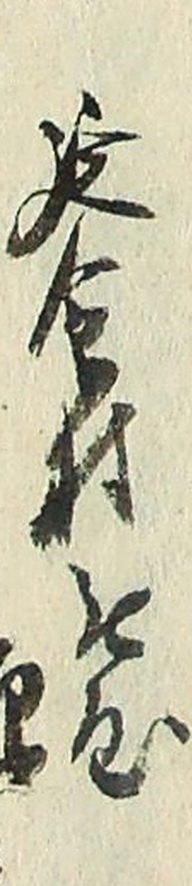延命村庄屋
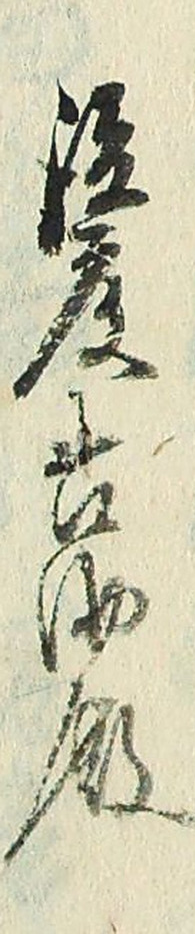後藤善助殿
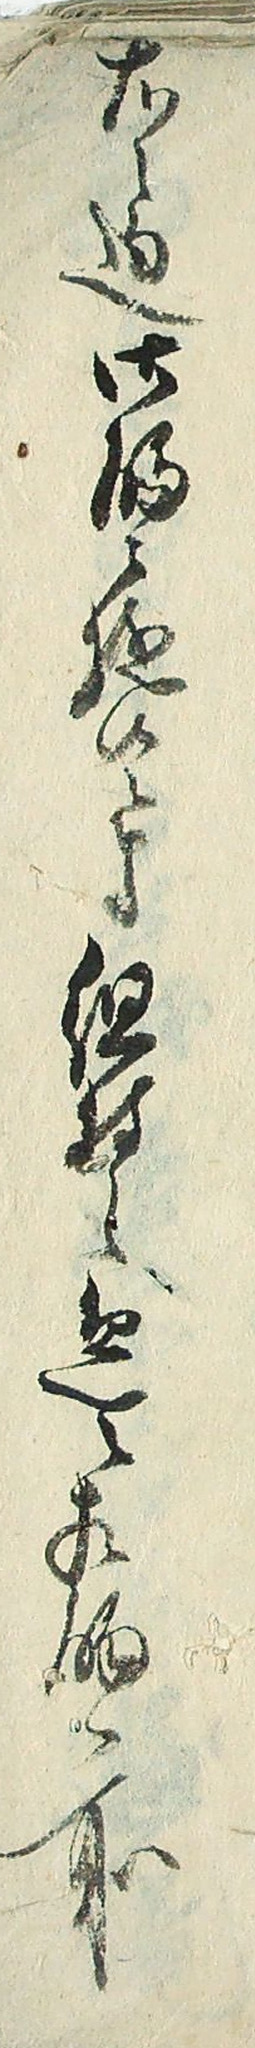右之通御触被遊候に付組村々逸々相触候所

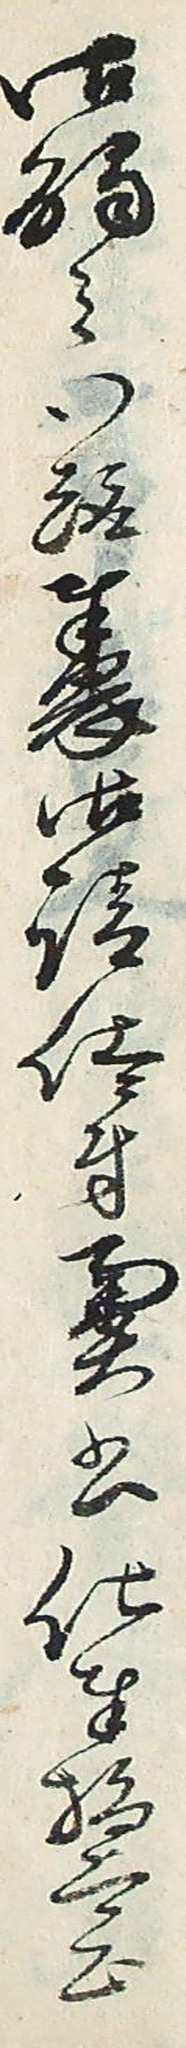御触之御趣奉畏御請仕に付奥書仕奉指上候以上
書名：諸御用御□受書控
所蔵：鳴門教育大学 Naruto University of Education
